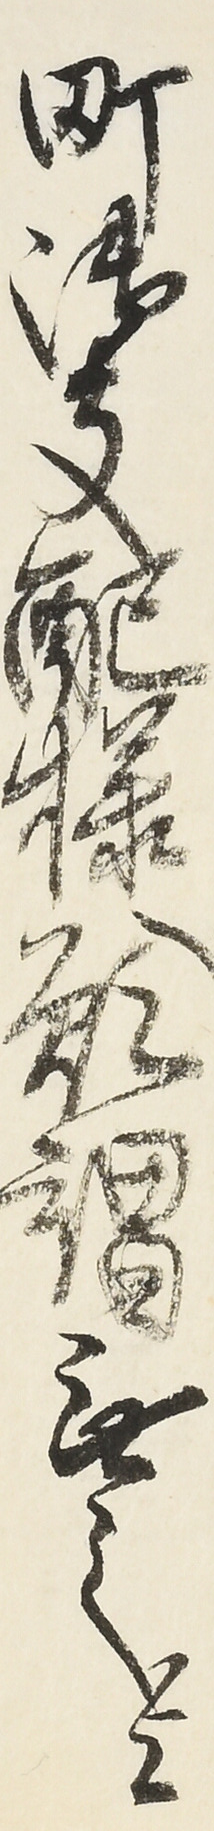町御支配様へ願謂無之与
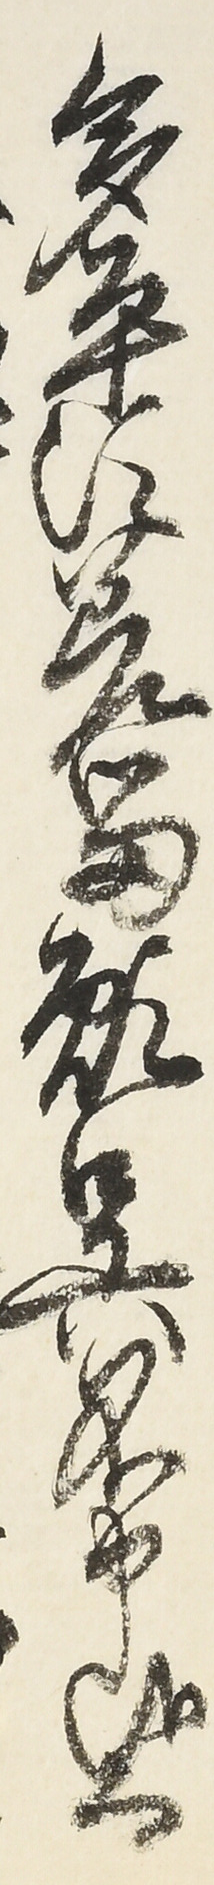多平治差留願呉不申候而
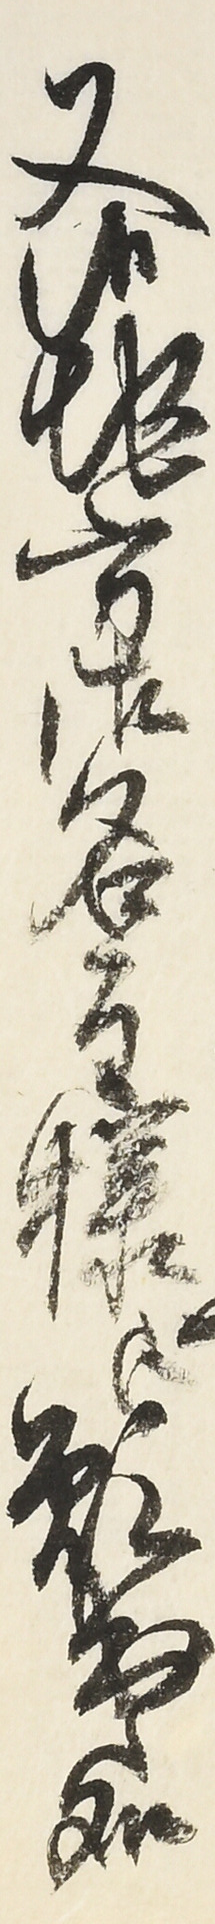又候地方御名主様江願出候処
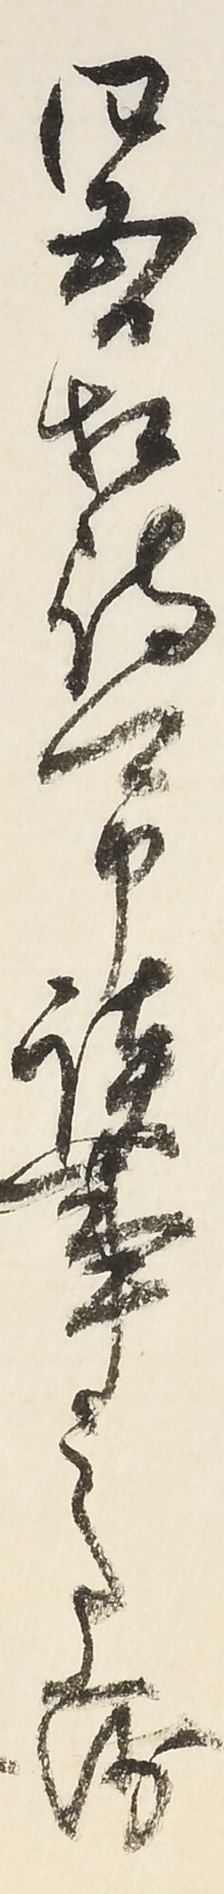四五日相待可申談事之上沙
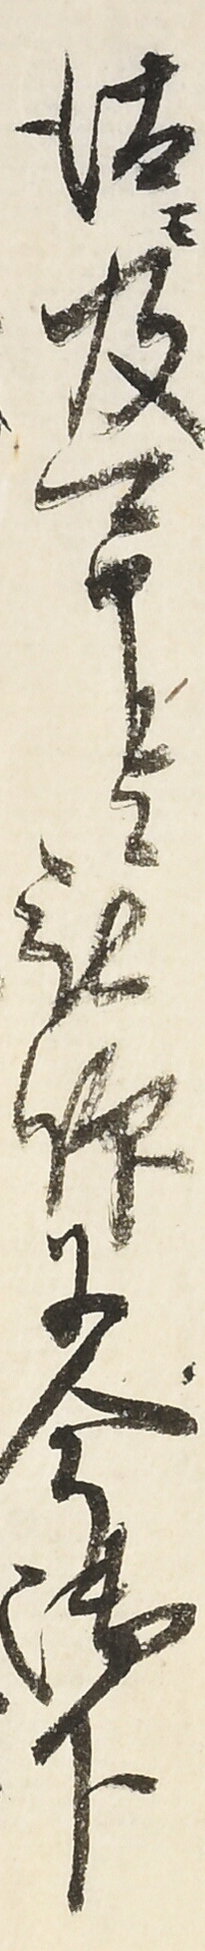汰ニ及可申与被仰于今御下
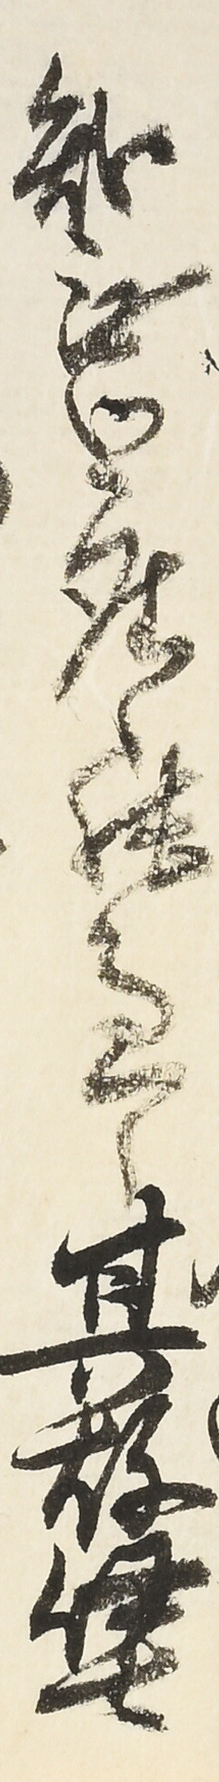知無御座候罷過候其故伊七
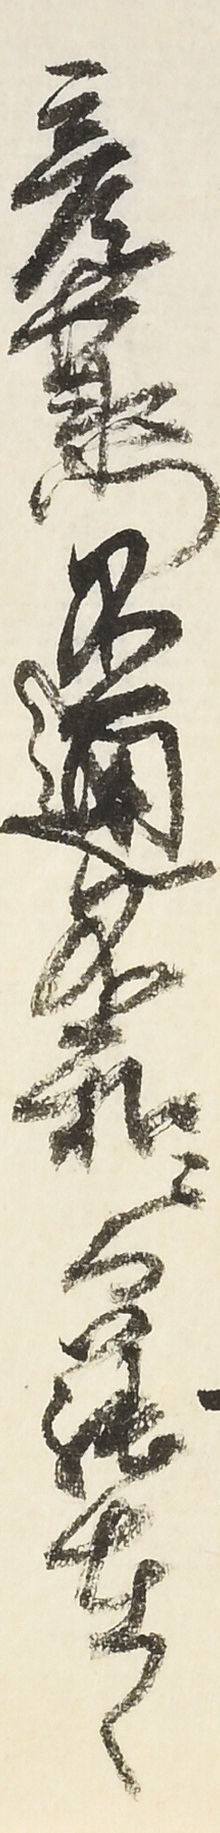彦右衛門不通不和ニ而罷在候
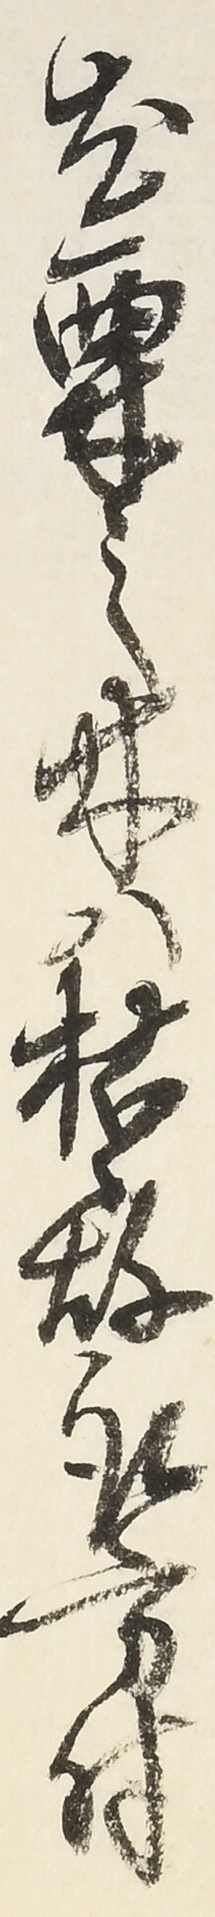尤栗之木ハ枯候故取方付
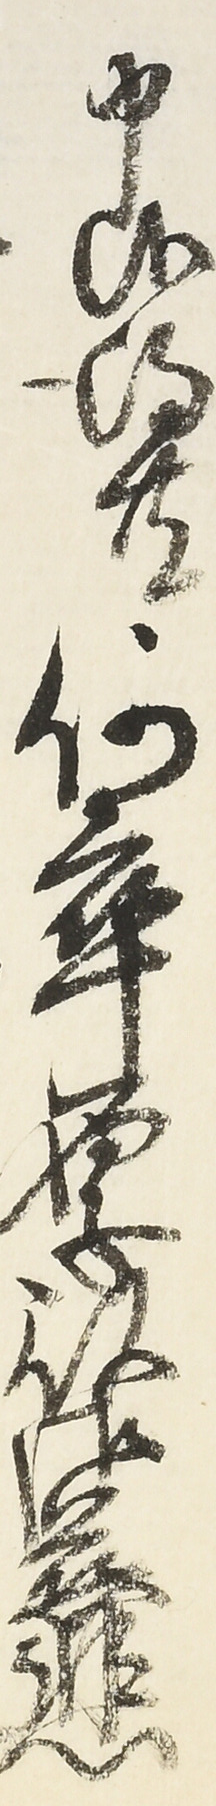申候得共何卒厚以御慈悲
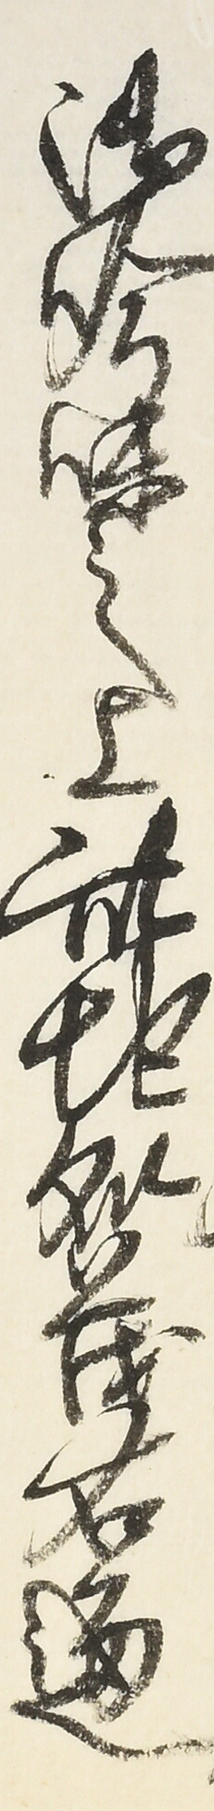御吟味之上此地処茂右通
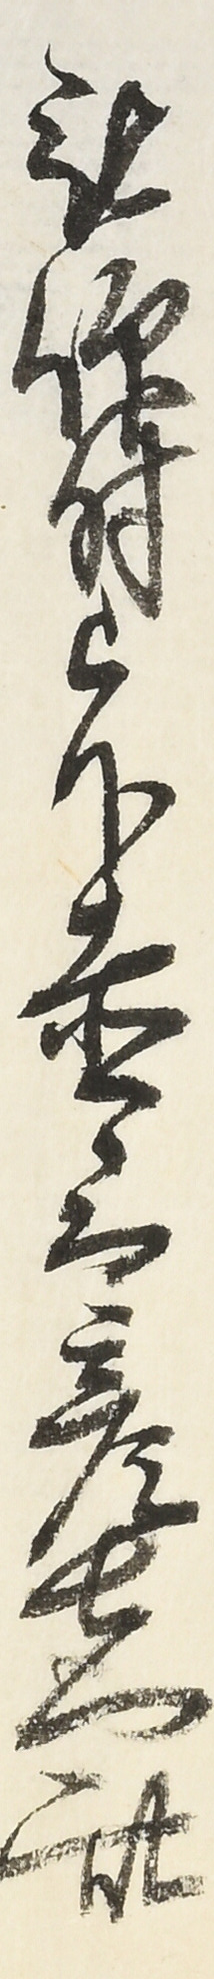被仰付被下置候而彦右衛門此
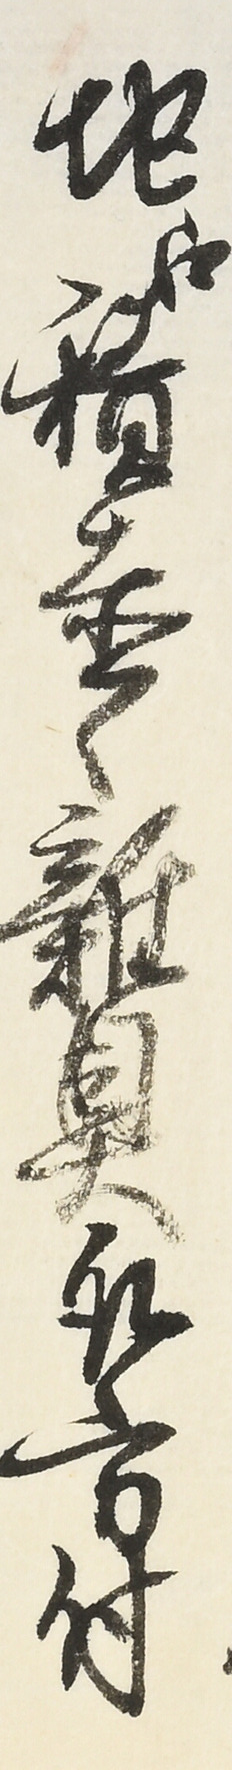地江積置候雑具外方付
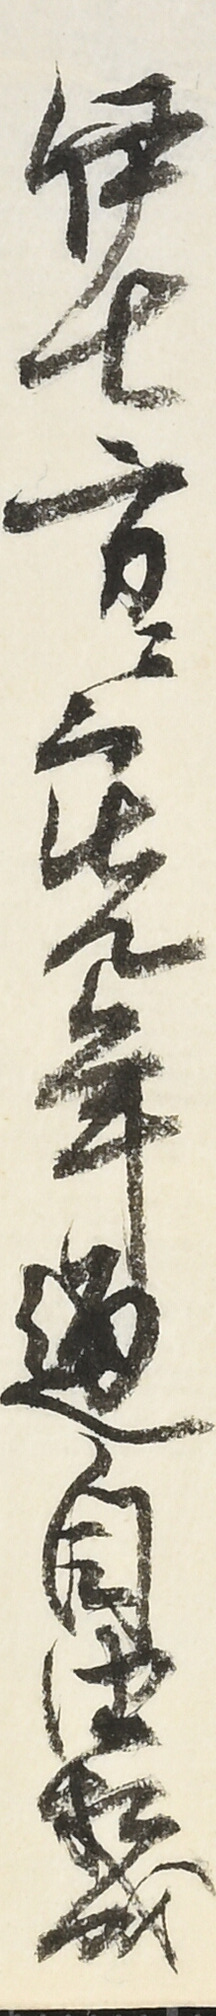伊七方ニ而先年通自由相成
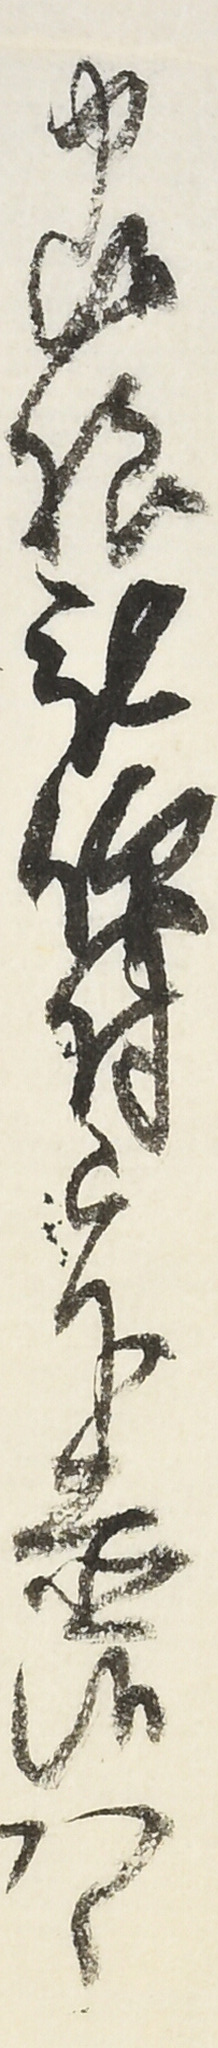申候様被仰付被下置候ハヽ
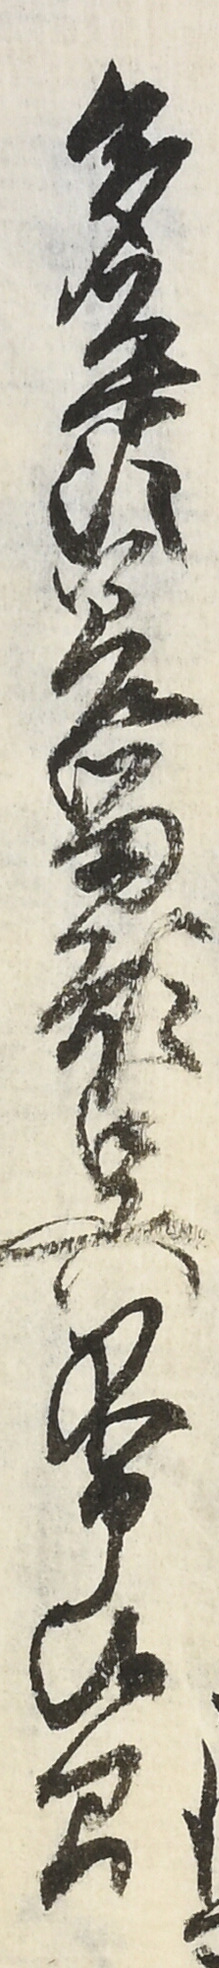多平治差留願呉不申候而

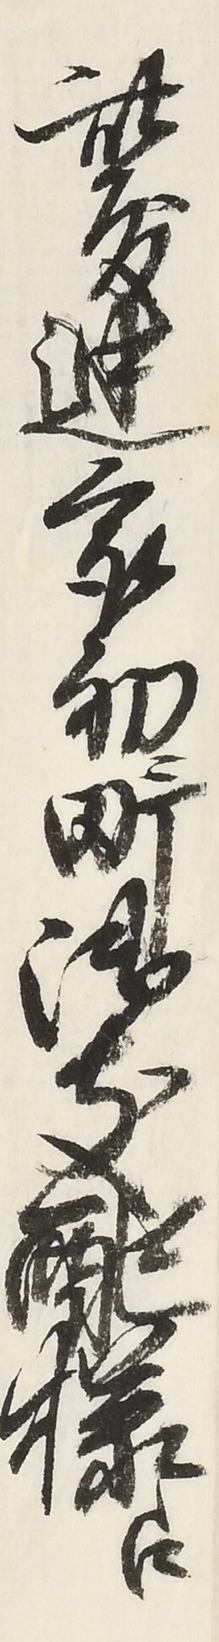此度最初ニ町御支配様江
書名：乍恐御内々子委奉申上度口上書
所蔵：伊那市立高遠町図書館・合同会社AMANE
